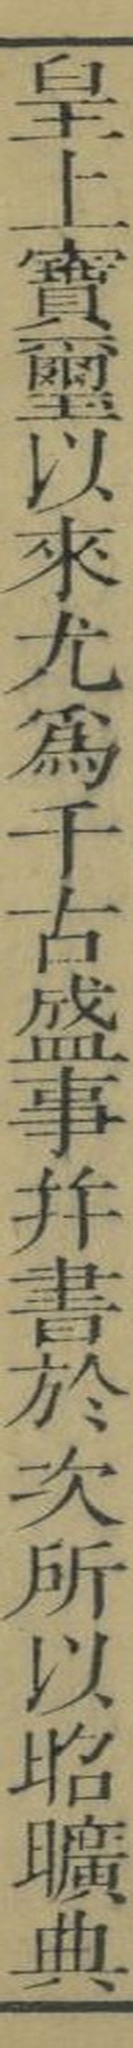皇上寶璽以來尤爲千古盛事幷書於次所以眧矌典
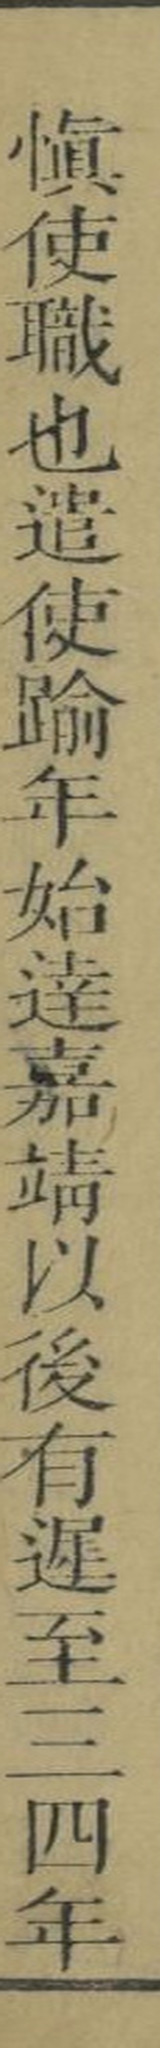愼使職也遣使踰年始逹嘉靖以後有遲至三四年

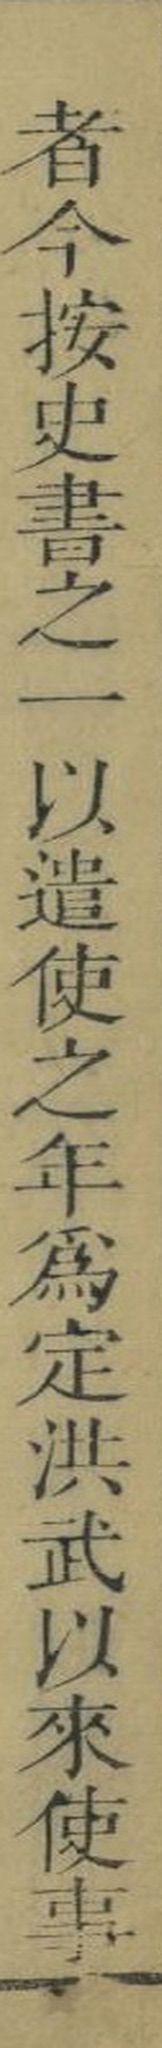者今按史書之一以遣使之年爲定洪武以來使事
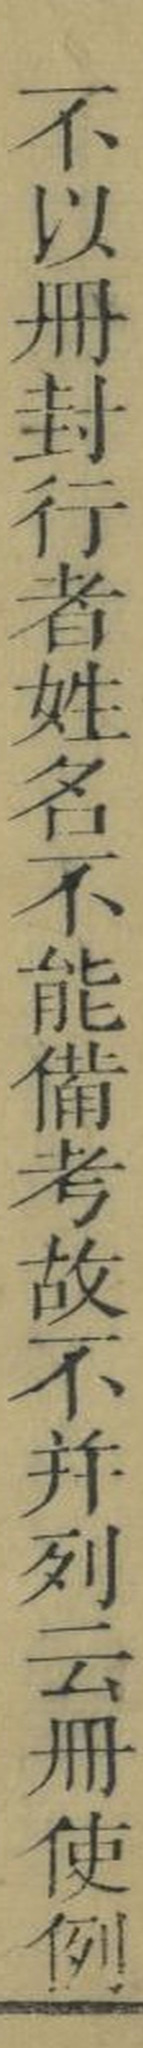不以冊封行者姓名不能備考故不幷列云冊使例
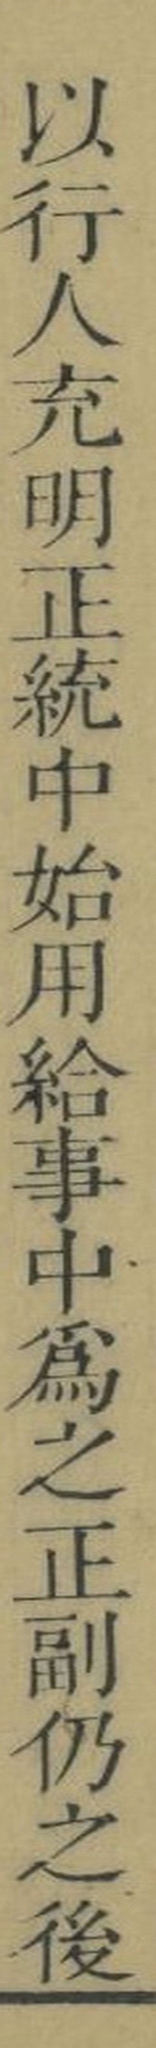以行人充明正統中始用給事中爲之正副仍之後
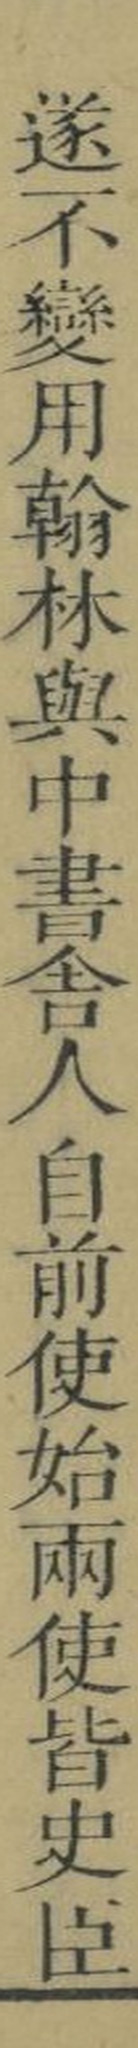遂不變用翰林與中書舎人自前使始兩使皆史臣
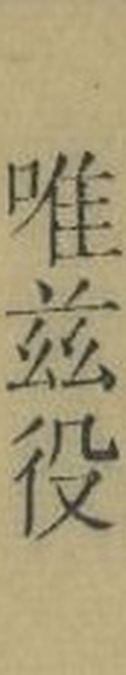唯茲役
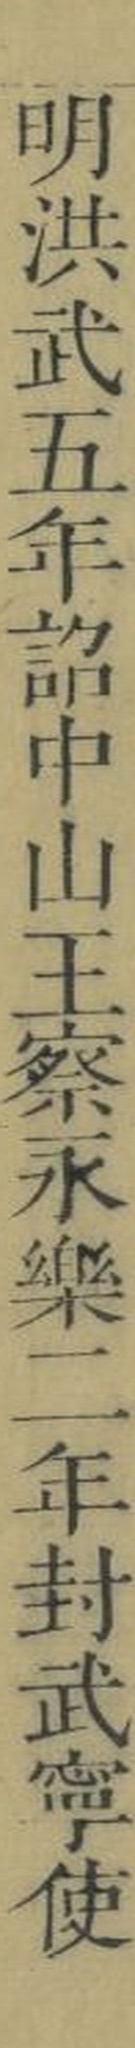明洪武五年詔中山王察永樂二年封武寧使
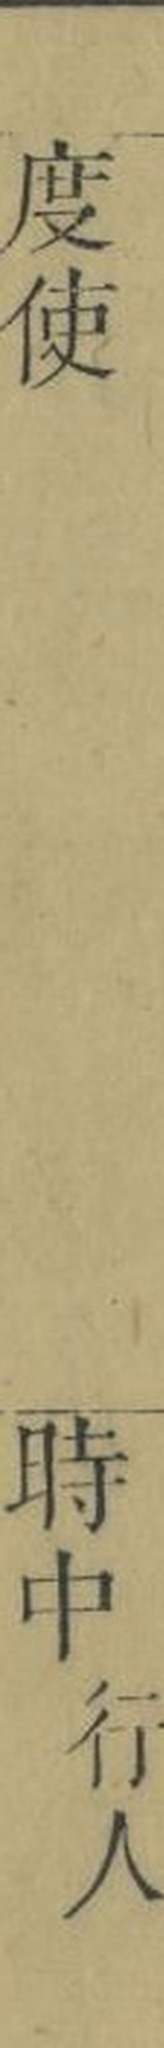度使時中行人
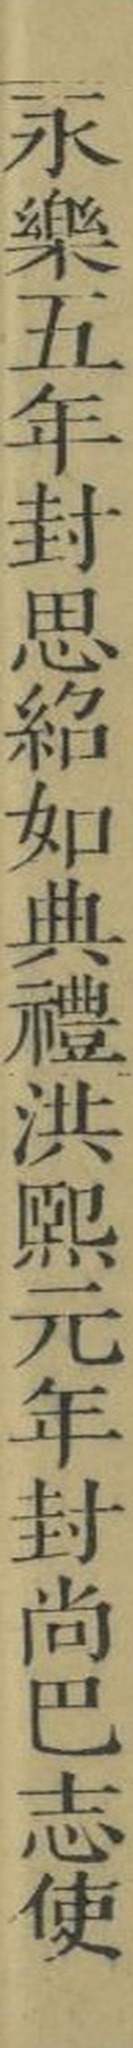永樂五年封思紹如典禮洪煕元年封尚巴志使
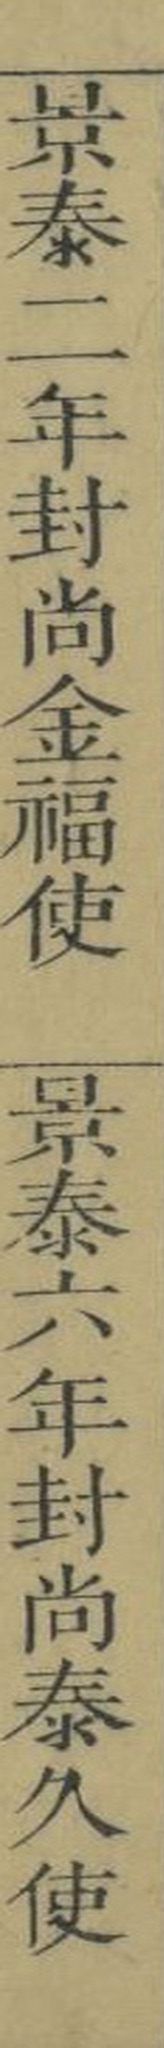景泰二年封尚金福使景泰六年封尚泰久使
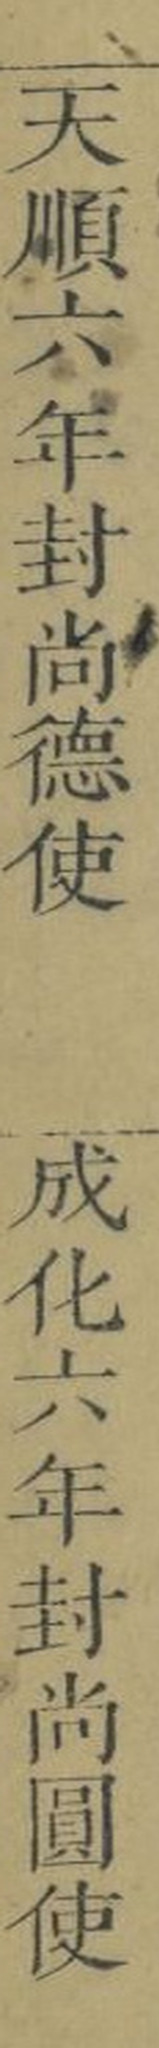天順六年封尚德使成化六年封尚圓使

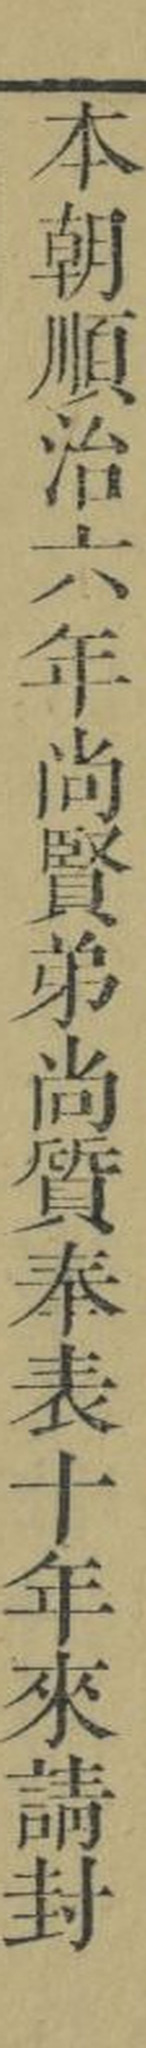本朝順治六年尚賢弟尚質奉表十年來請封
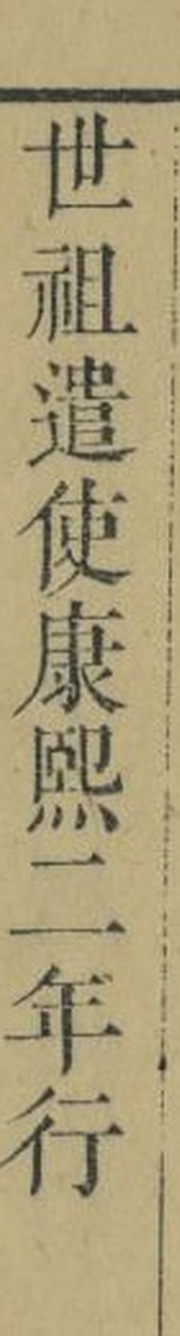世祖遣使康煕二年行
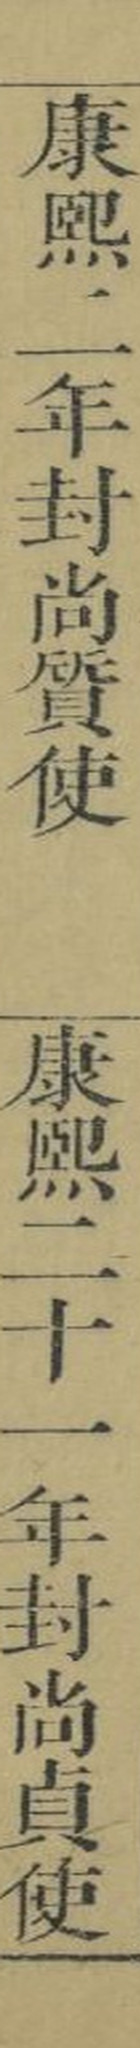康煕二年封尚質使康煕二十一年封尚貞使

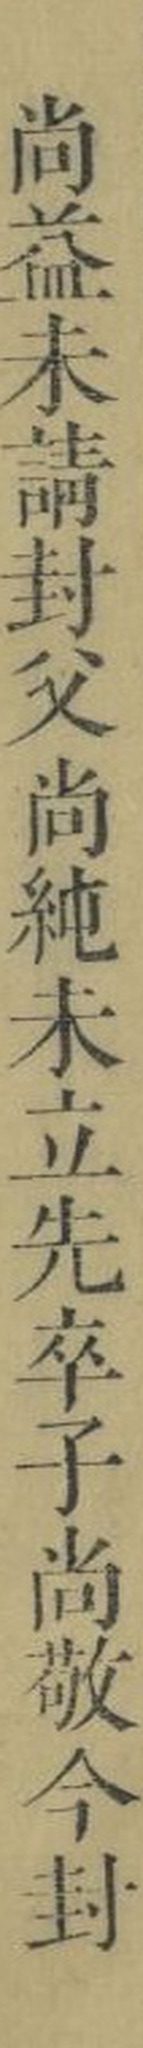尚益未請封父尚純未立先卒子尚敬今封
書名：中山伝信録 巻二
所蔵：University of the Ryukyus Library
